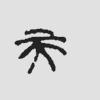天
